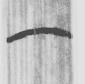一
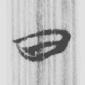日
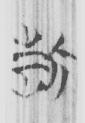折
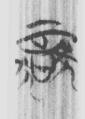獄
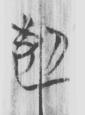{叀刀}
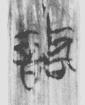詒
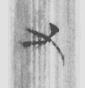又
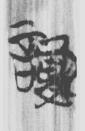謱
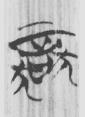獄
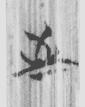至
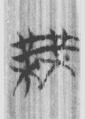無
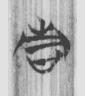青
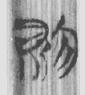則
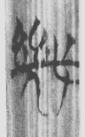幾
